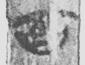百
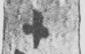十
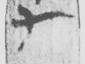九
